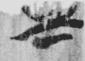至
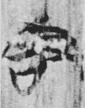命
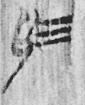於
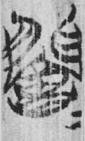閤門
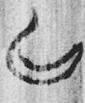㠯（以）
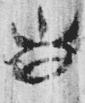告
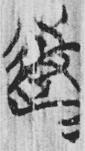寺寺
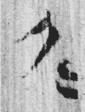人人
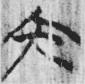內（入）
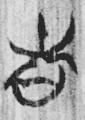告
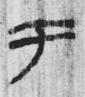于
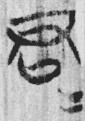君君
